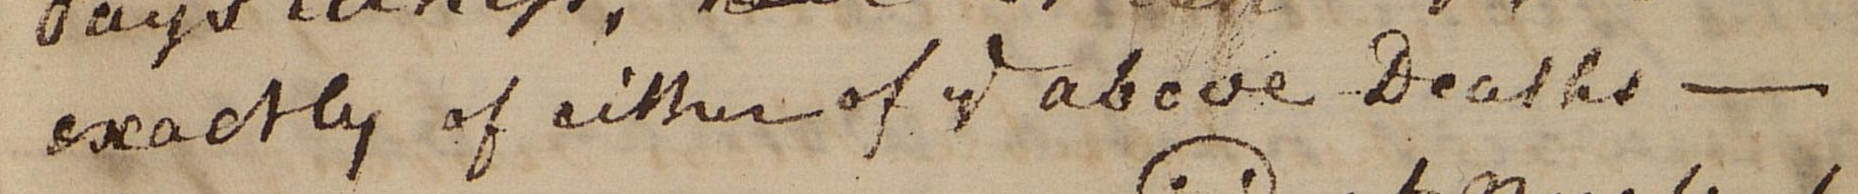exactly of either of y^e above Deaths-
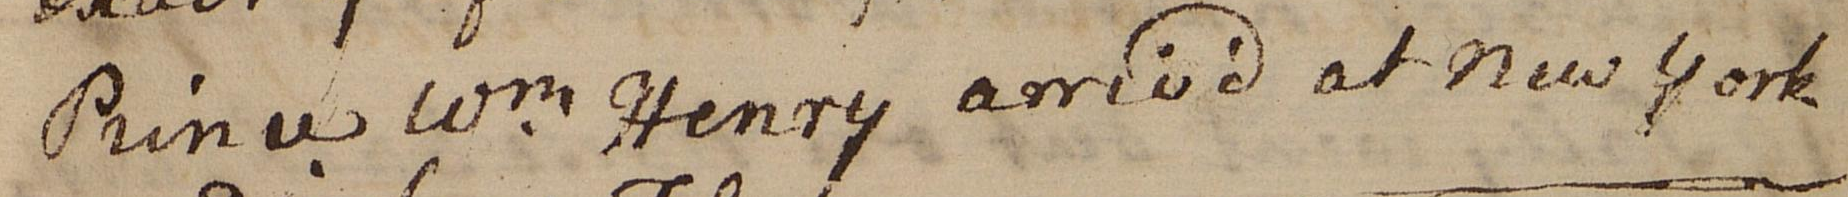Prince W^m. Henry arriv'd at New York
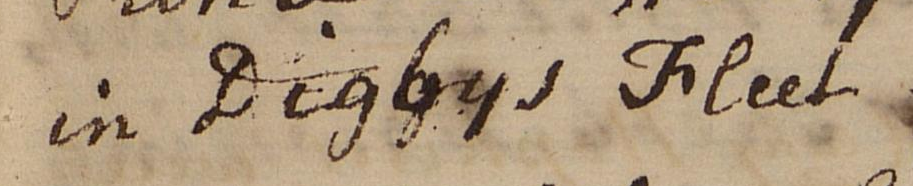in Digbys Fleet
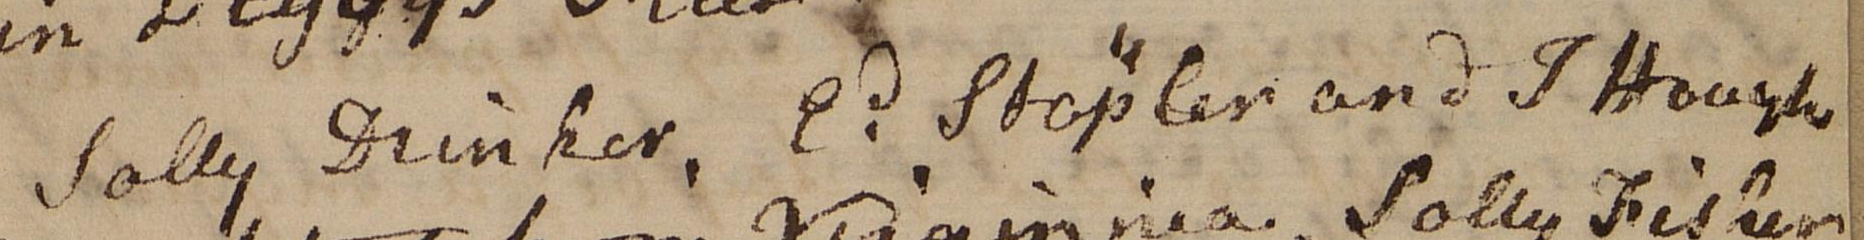Sally Drinker, E^d. Stapler and I Hough
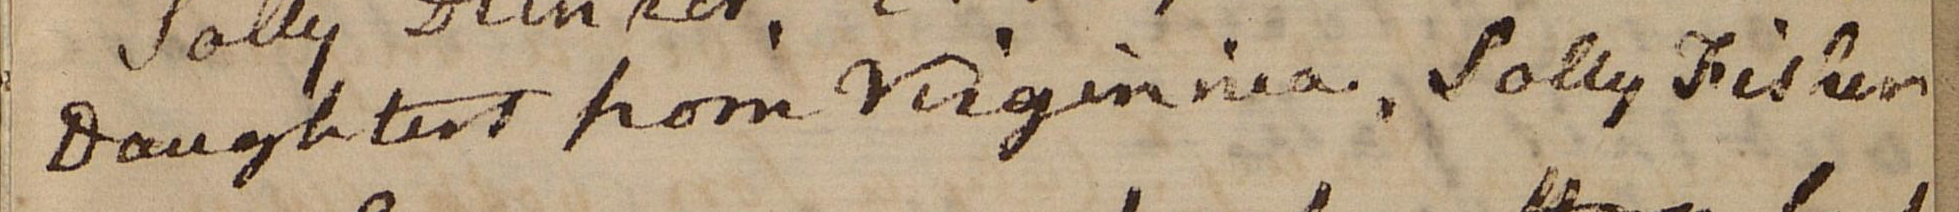Daughters from Virginnia, Sally Fisher
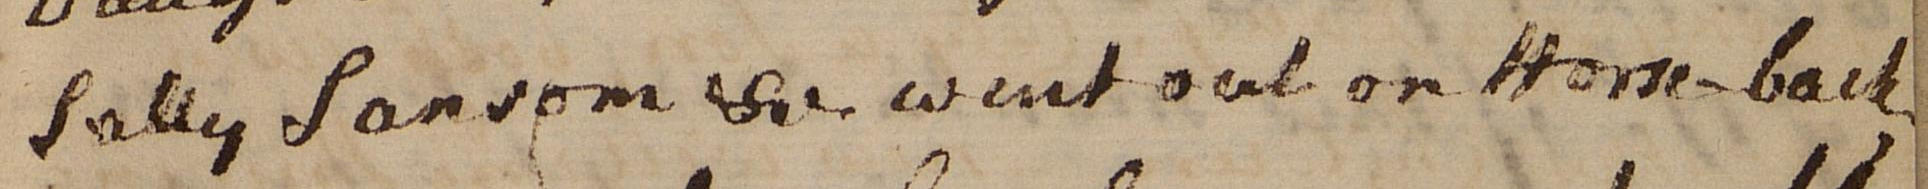Sally Sansom &c went out on Horse-back
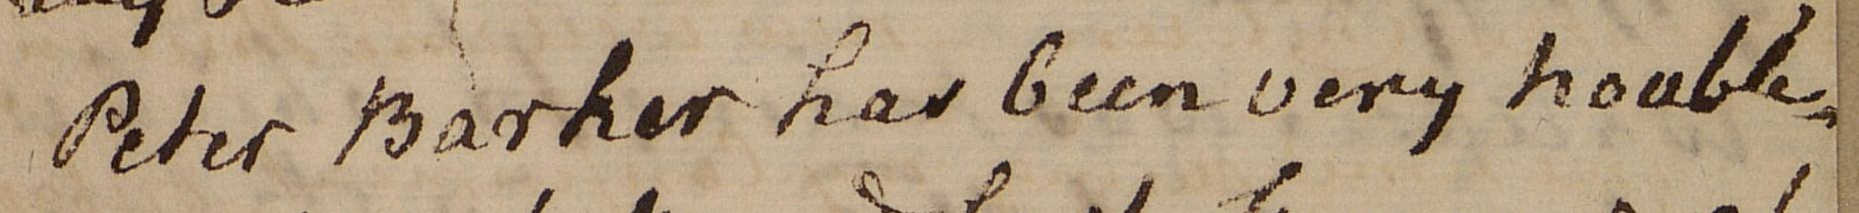Peter Barker has been very trouble-
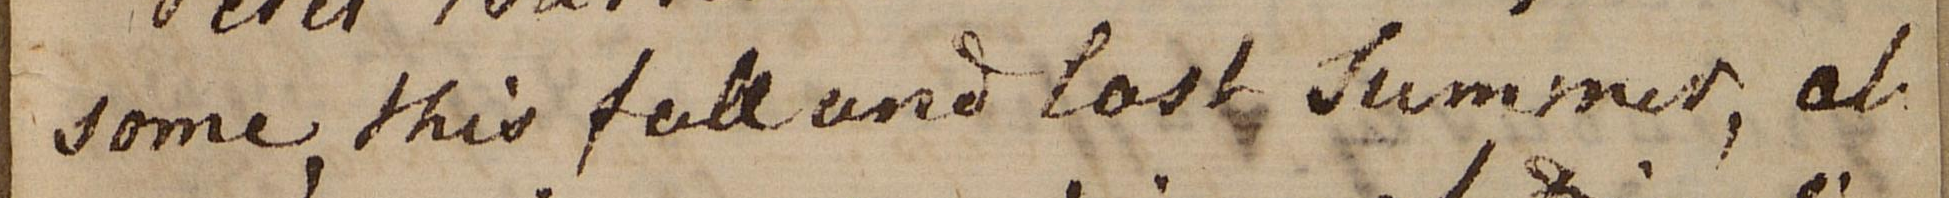some, this fall and last summer, al
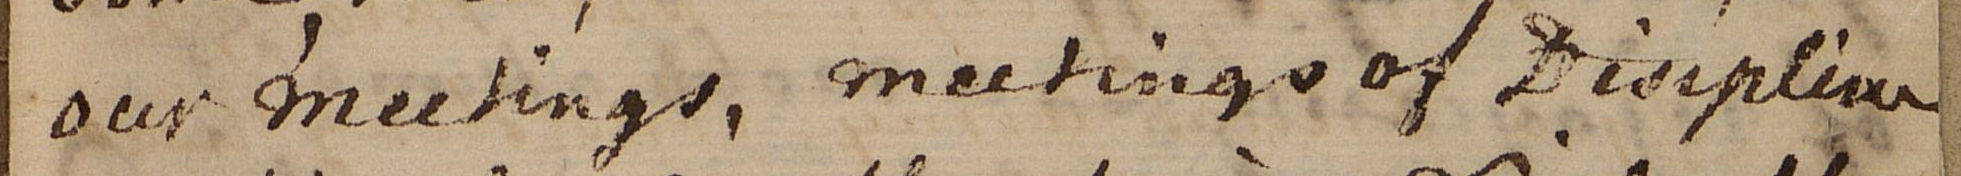our meetings, meetings of Disipline
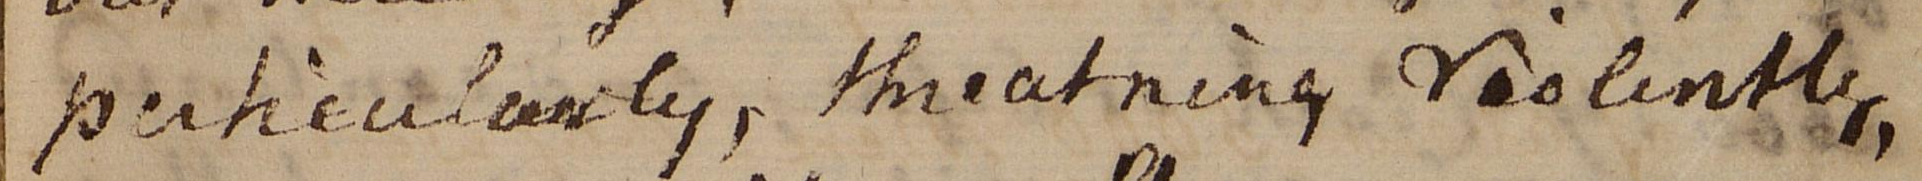particularly, threatning Violently,
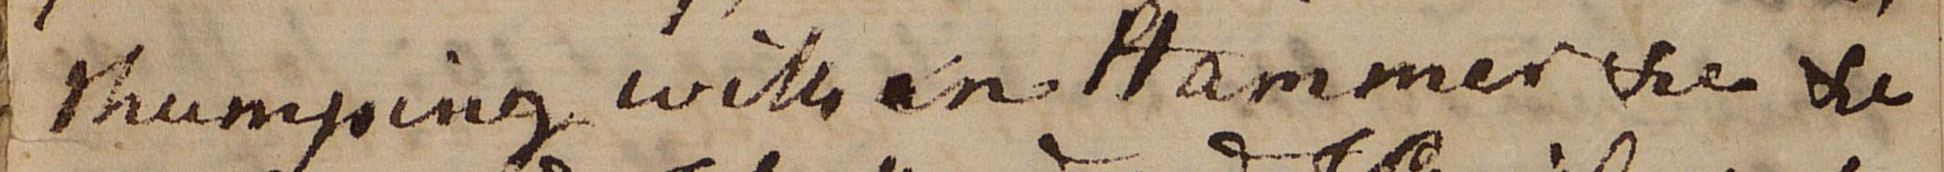thumping with an Hammer &c &c
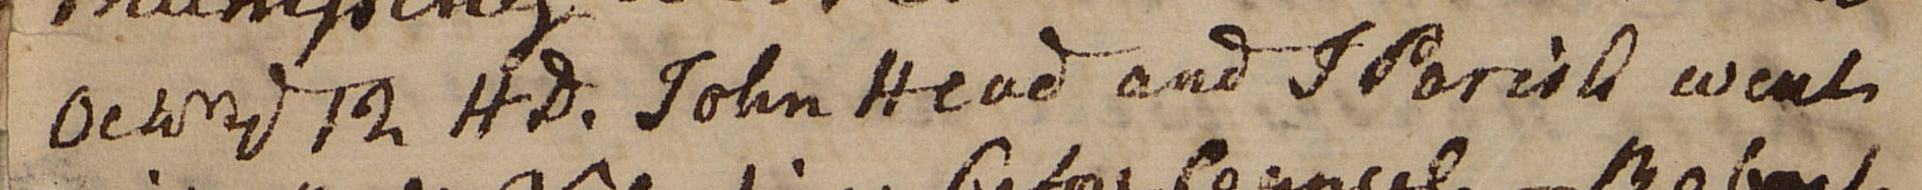Oct^r 12 HD. John Head and J Parish went
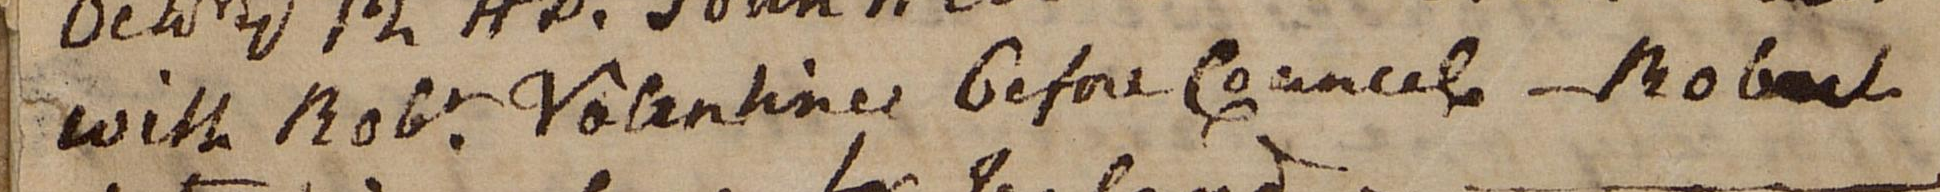with Rob^t. Valentine before Councel- Robert
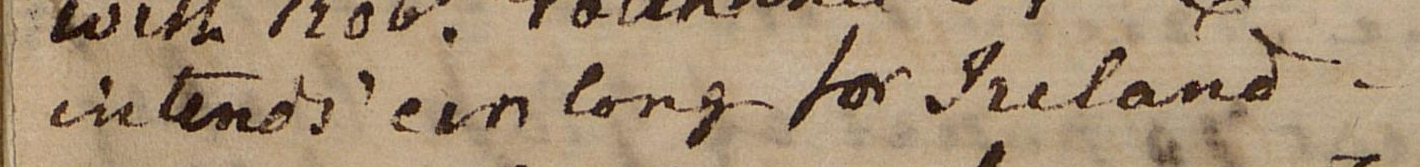intends cin long for Ireland-
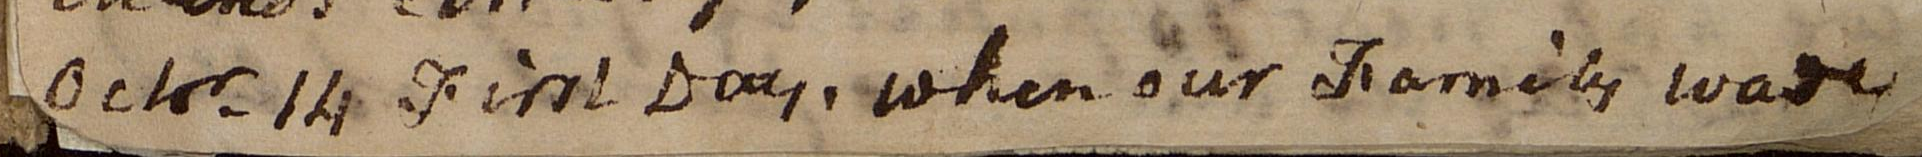Oct^r 14 First Day. when our Family was
